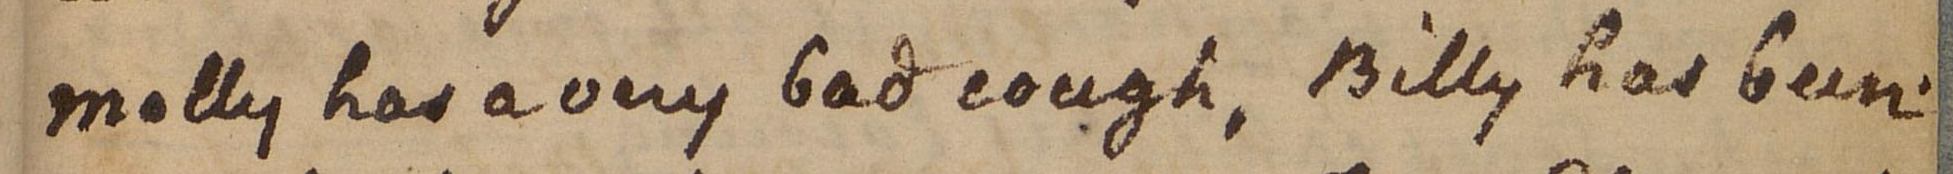Molly has a very bad cough, Billy has been
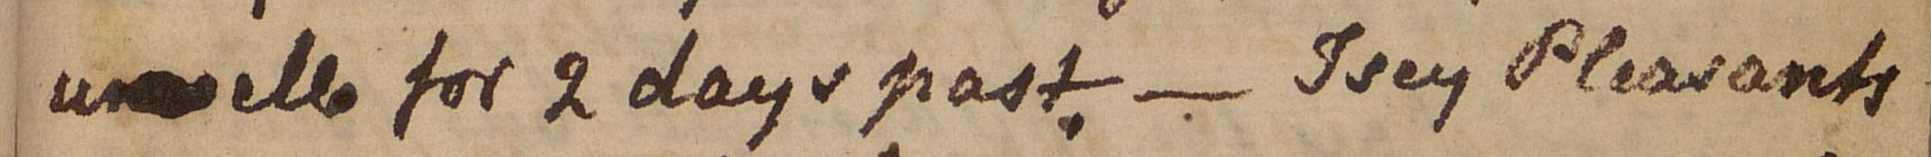unwell for 2 days past- Jsey Pleasants
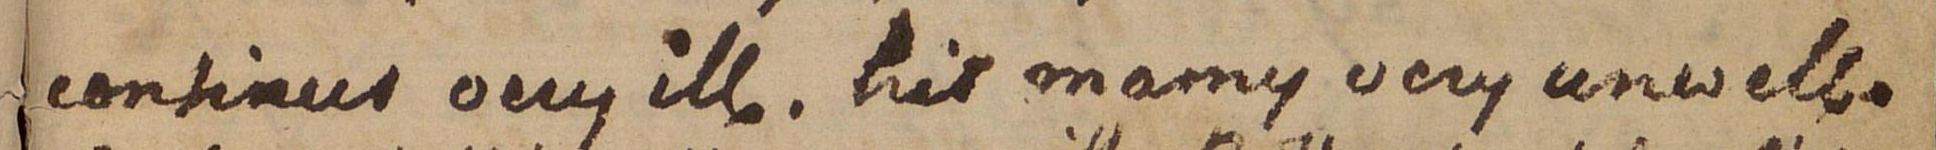continues very ill. his mamy very unwell.
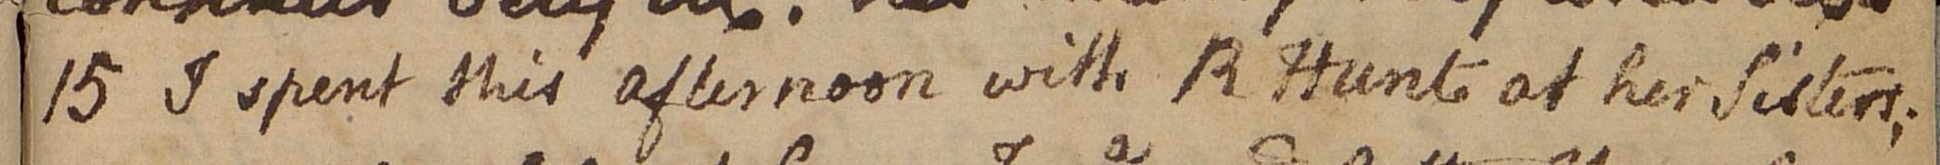15 I spent this afternoon with R Hunt at her Sisters;
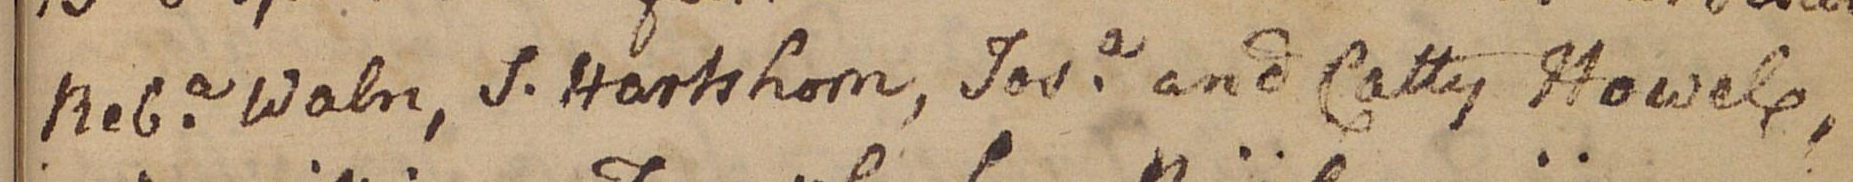Reb^a. Waln, S. Hartshorn, Jos^a. and Catty Howel,
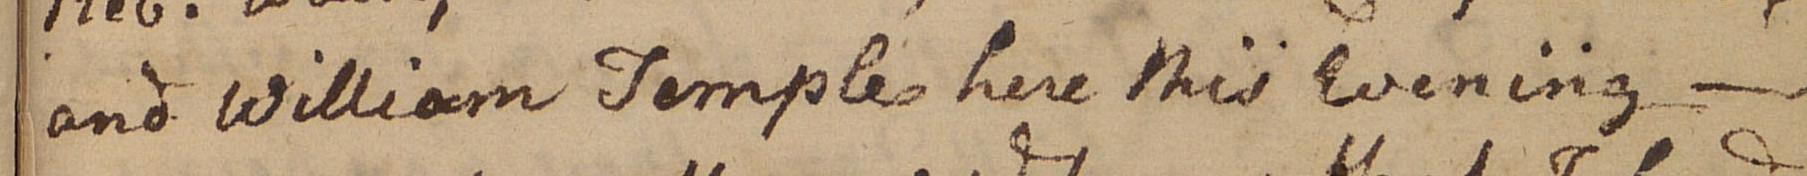and William Temple here this Evening-
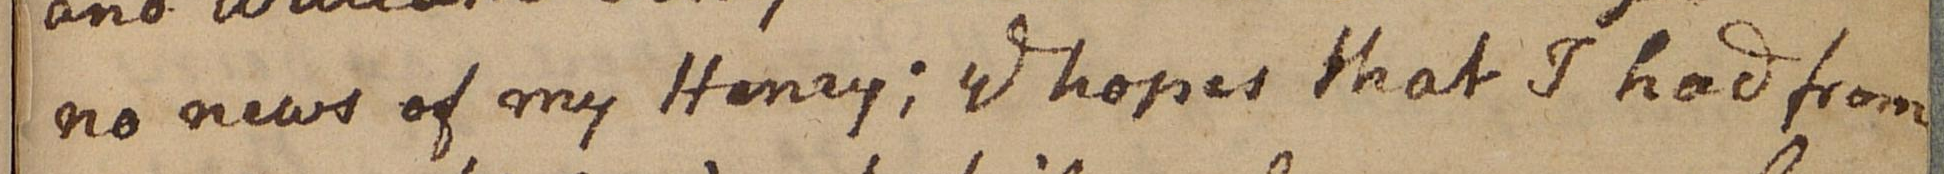no news of my Henry; y^e hopes that I had from
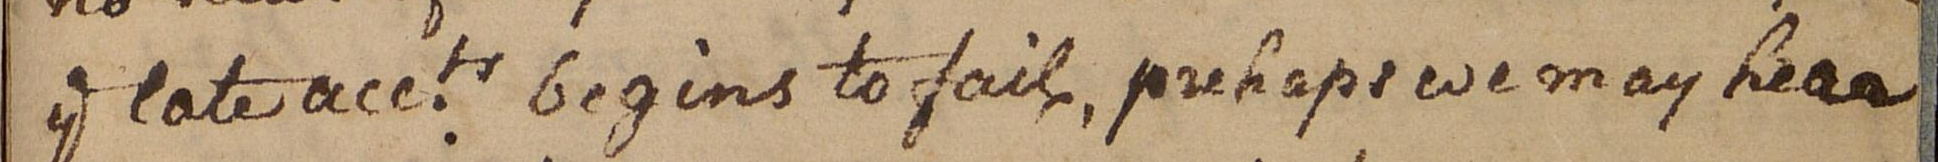y^e late acc^ts. begins to fail, prehaps we may hear
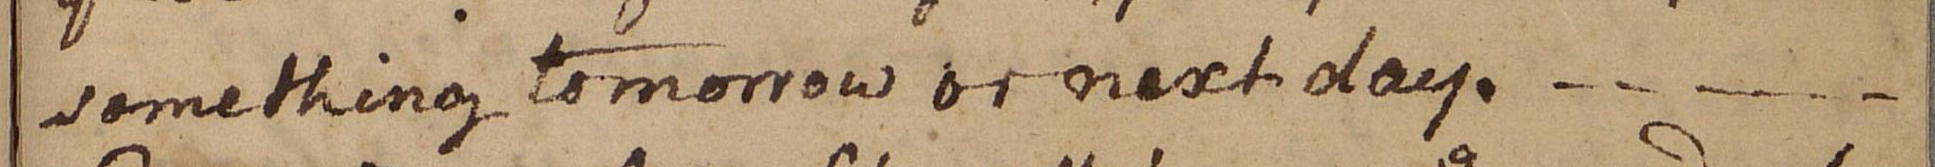something tomorrow or next day.-
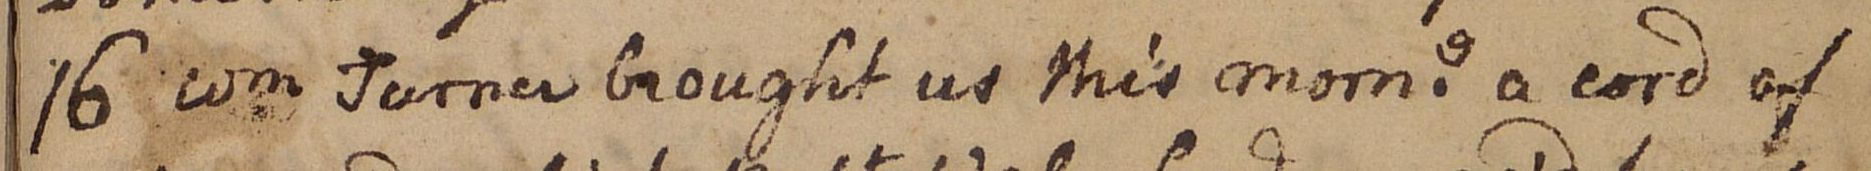16 W^m Turner brought us this morn^g. a cord of
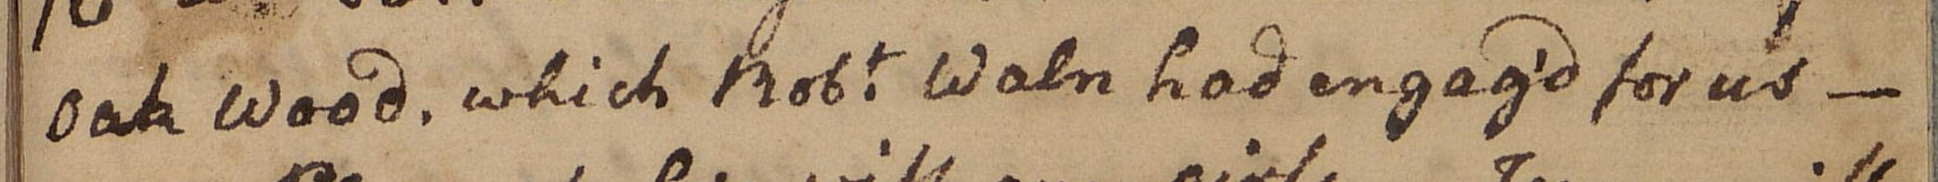Oak Wood, which Rob^t. Waln had engag'd for us-
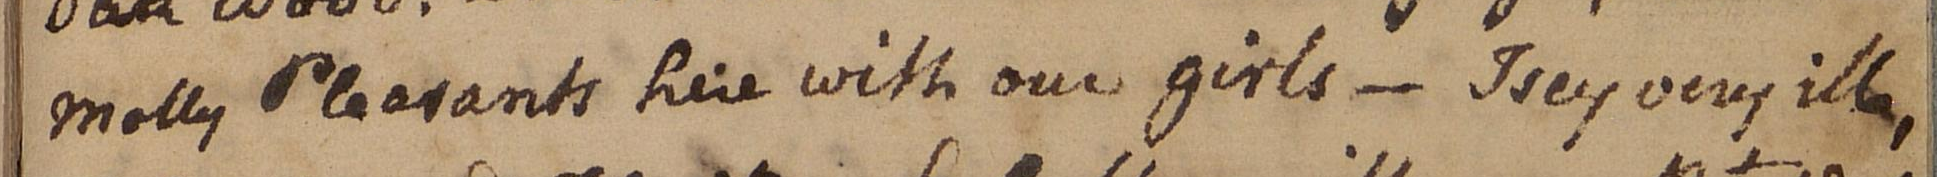Molly Pleasants here with our girls- Jsey very ill,
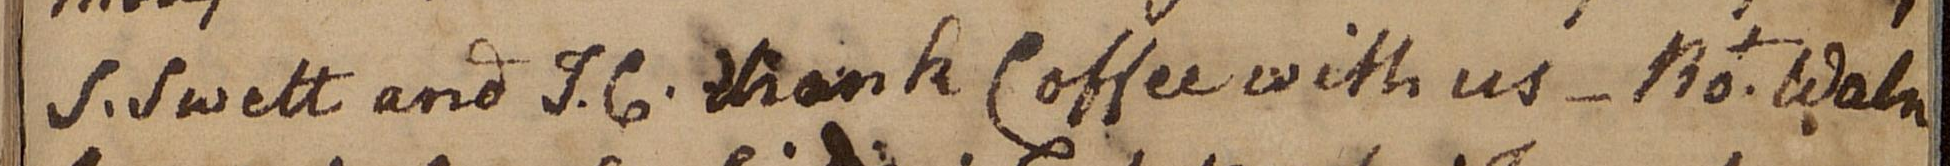S. Swett and I.C. drank Coffee with us- Ro^t. Waln
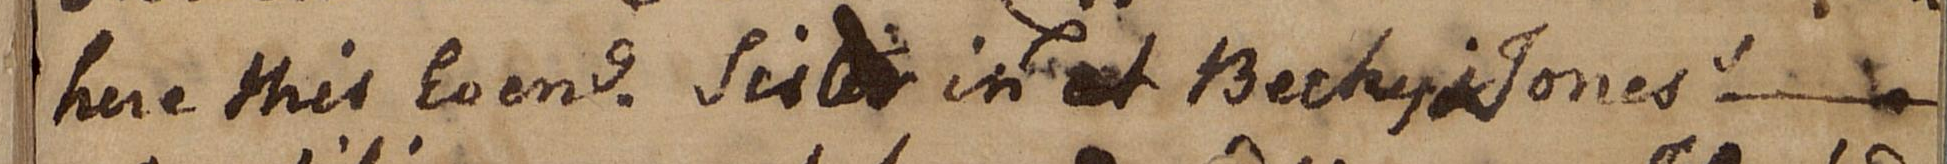here this Even^g. Sister in [at] Becky Jones^s-
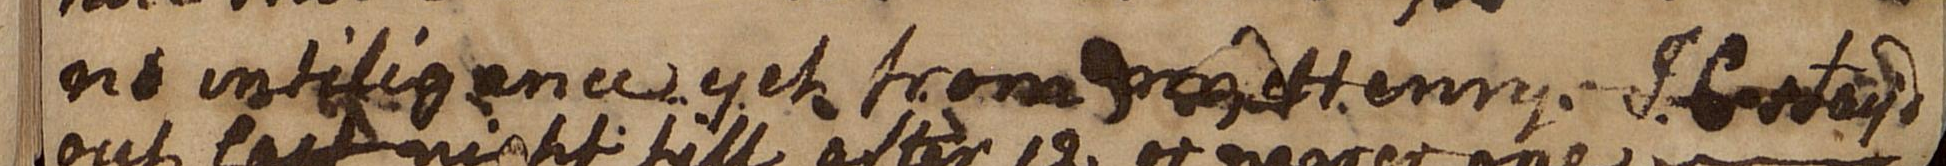no intiligence yet from [____] Henry. I.C. stay'd
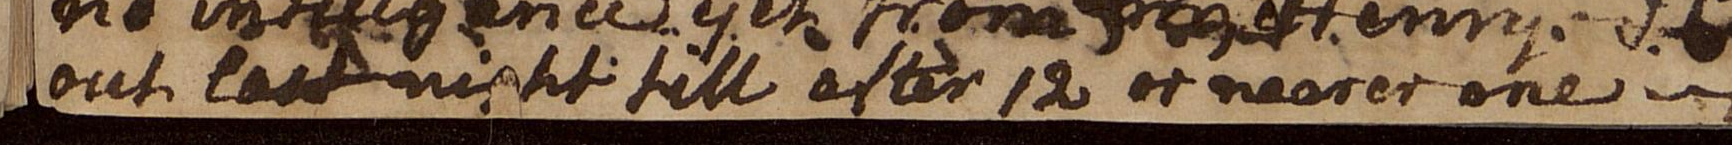out last night till after 12 at nearer one-
